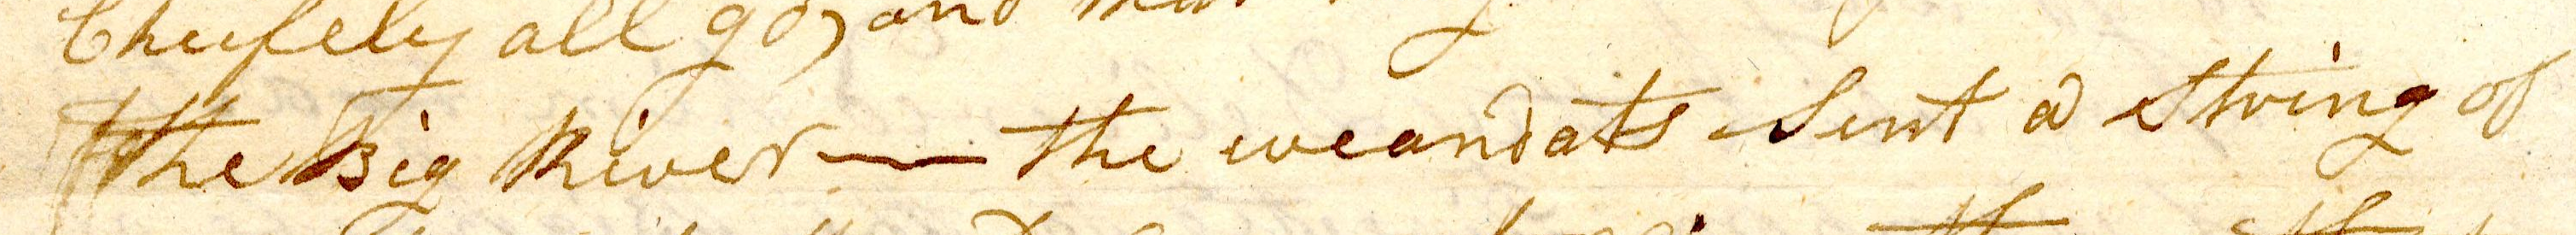the Big River- the weandats sent a String of
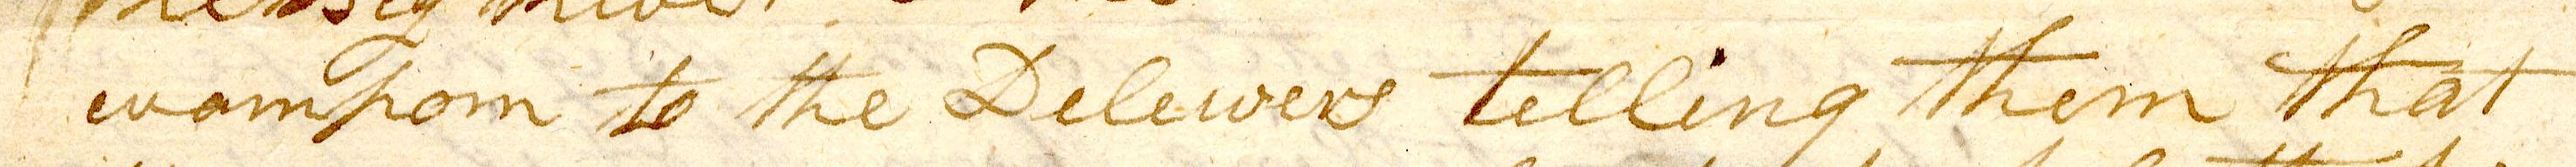wampom to the Delewers telling them that
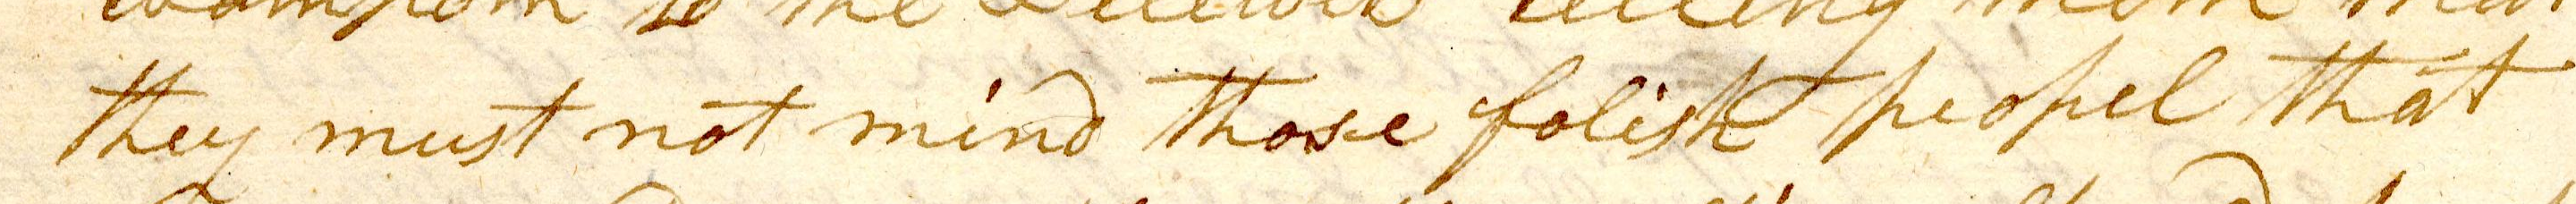they must not mind those folish peopel that
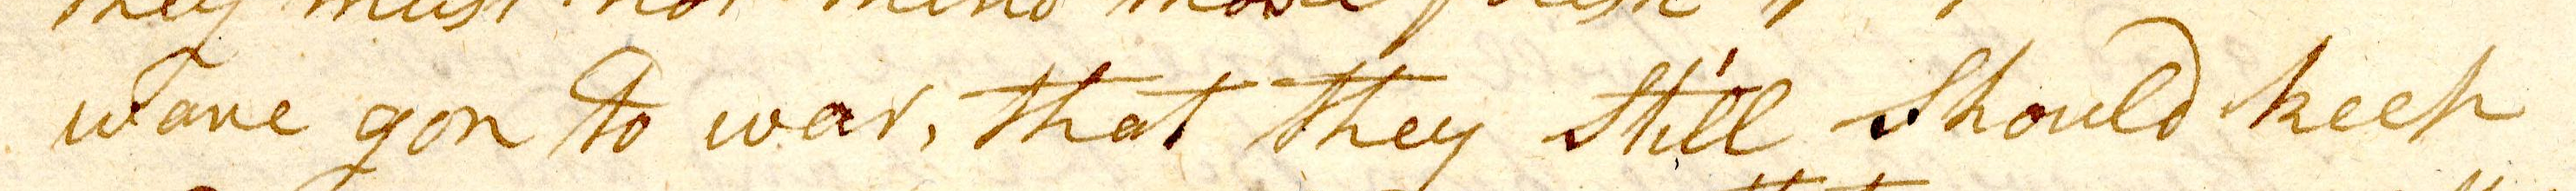were gon to war, that they still should keep
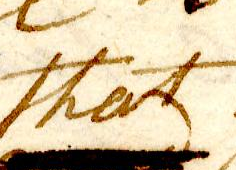that
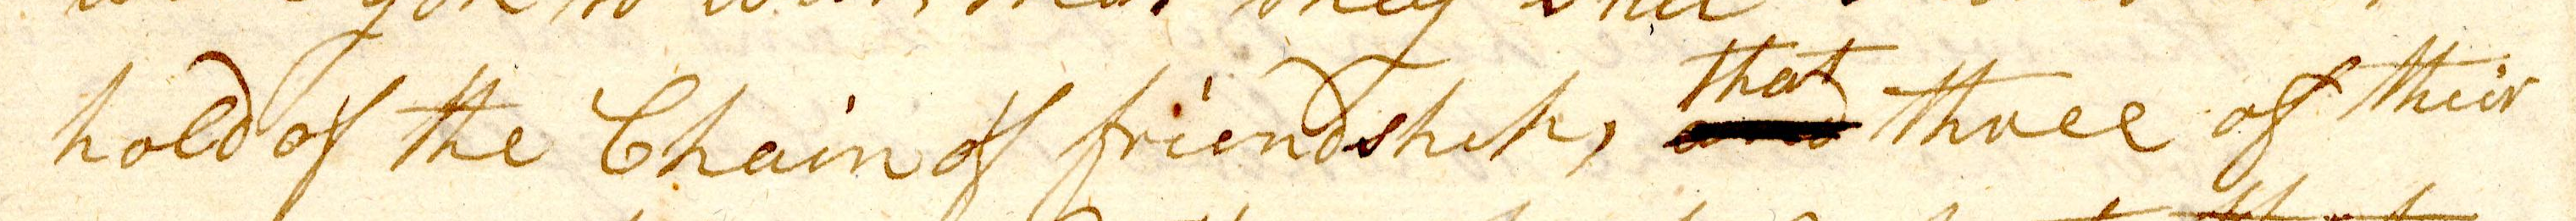hold of the Chain of friendships, [and] three of their
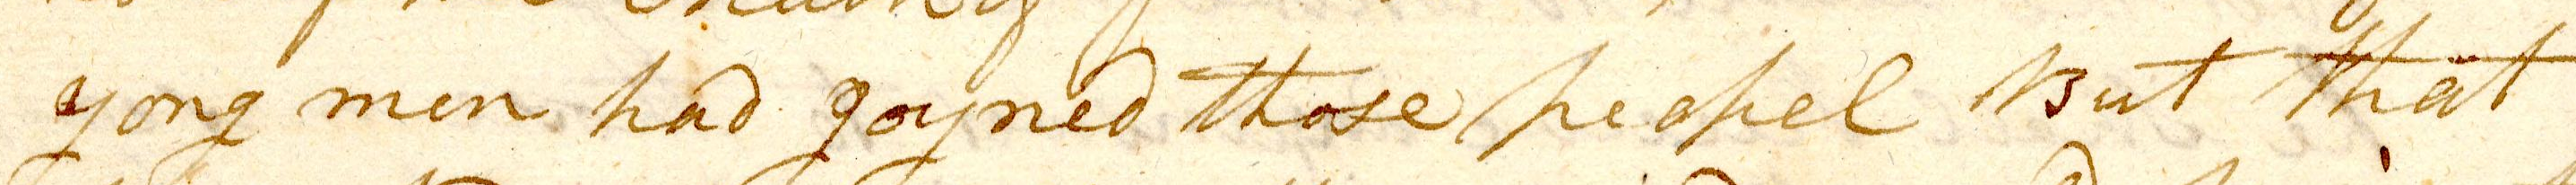yong men had joyned those peopel But that
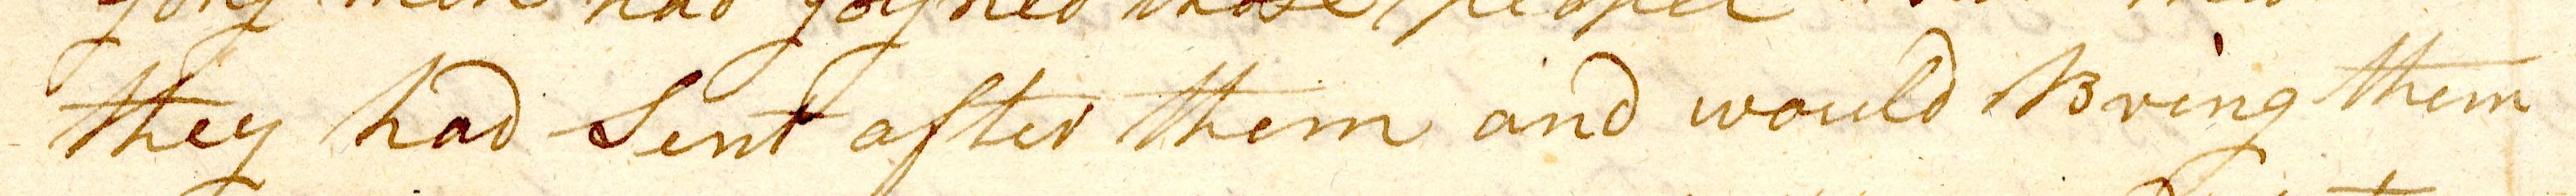they had Sent after them and would Bring them
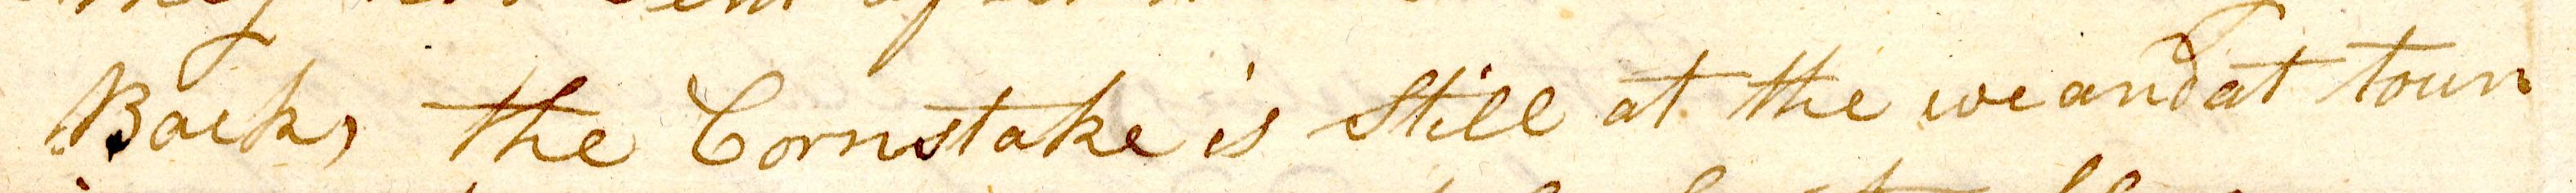Back, the Cornstake is still at the weandat toun
